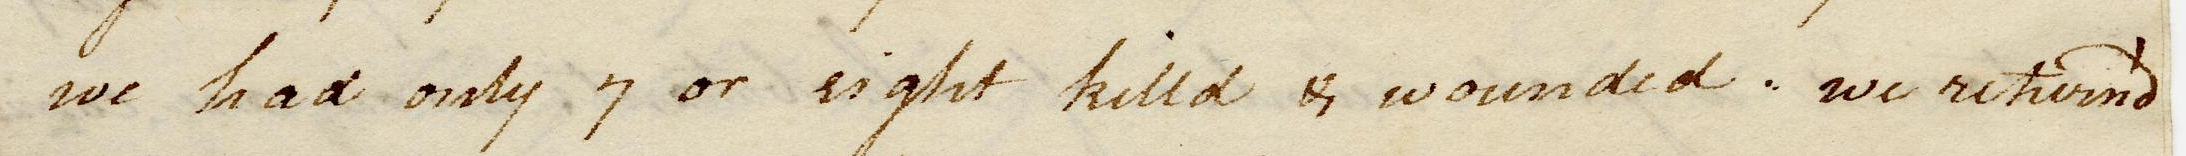we had only 7 or eight killd & wounded. we return'd
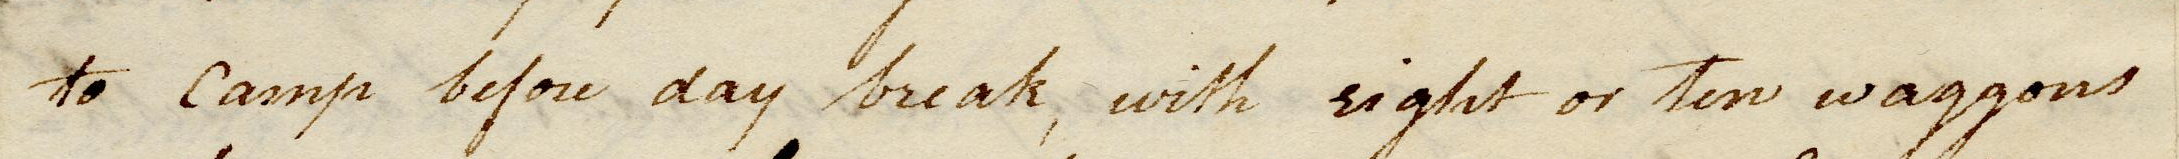to Camp before day break, with eight or ten waggons
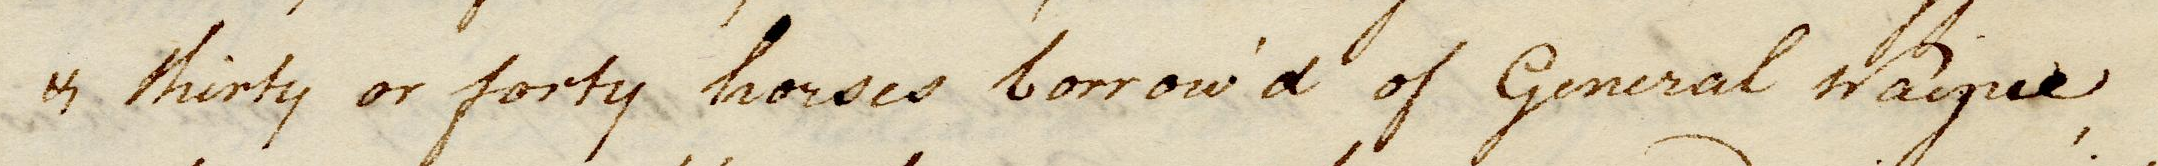& thirty or forty horses borrow'd of General Wayne
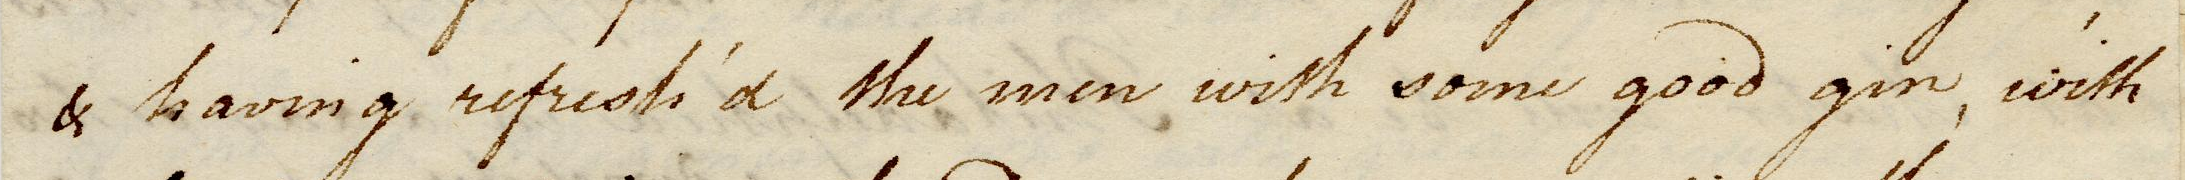& having refresh'd the men with some good gin, with
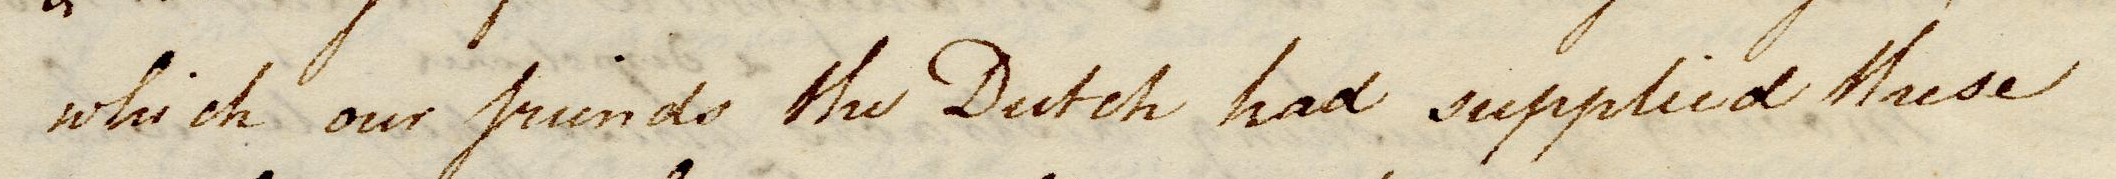which our friends the Dutch had supplied these
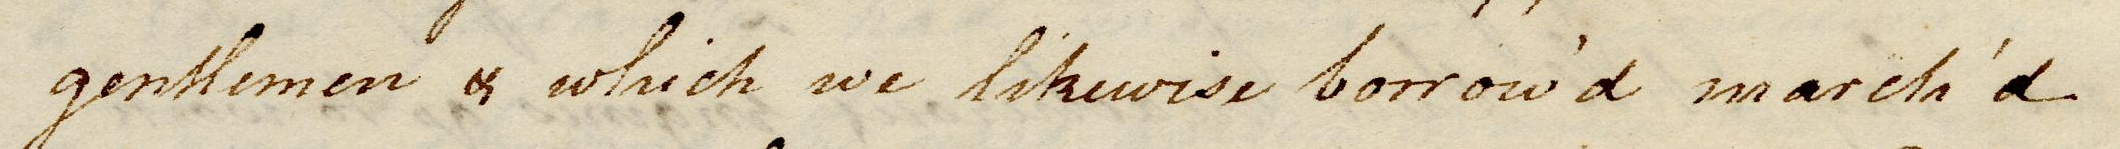gentlemen & which we likewise borrow'd march'd
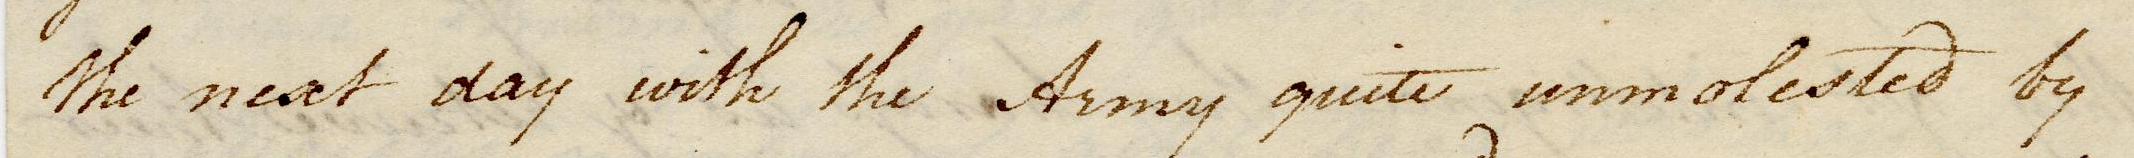the next day with the Army quite unmolested by
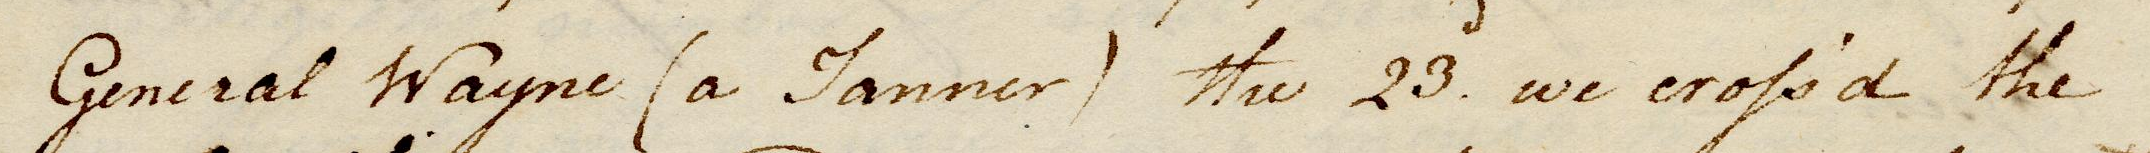General Wayne (a Tanner) the 23^d. we cross'd the
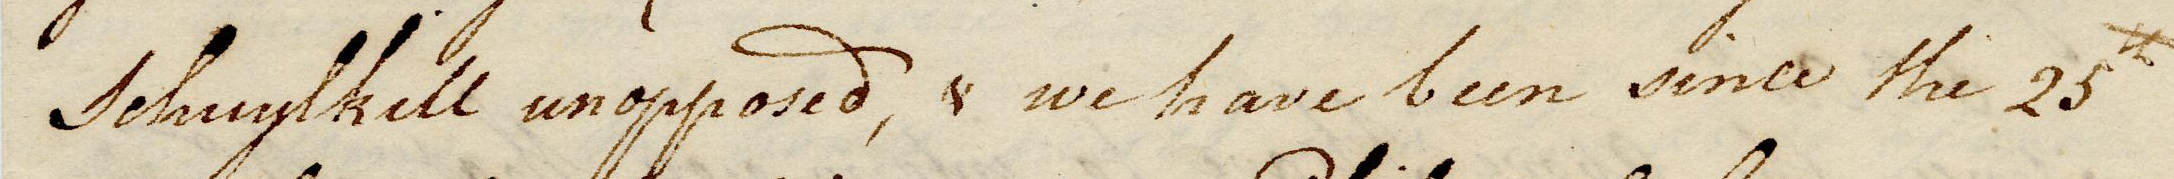Schuylkill unopposed, & we have been since the 25^th
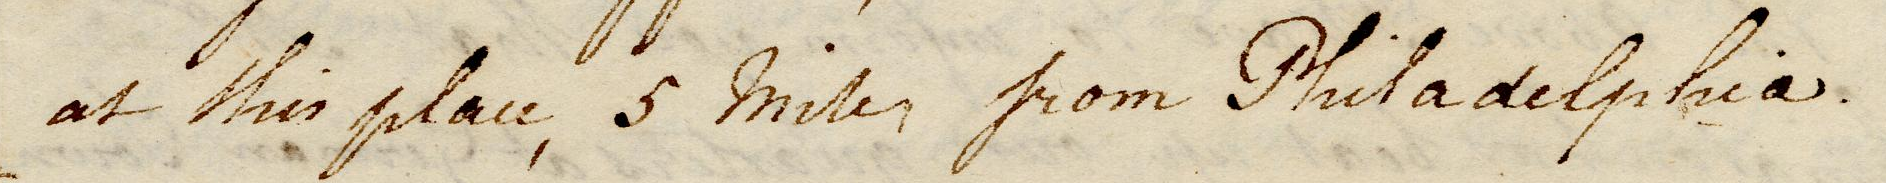at this place 5 miles from Philadelphia.
